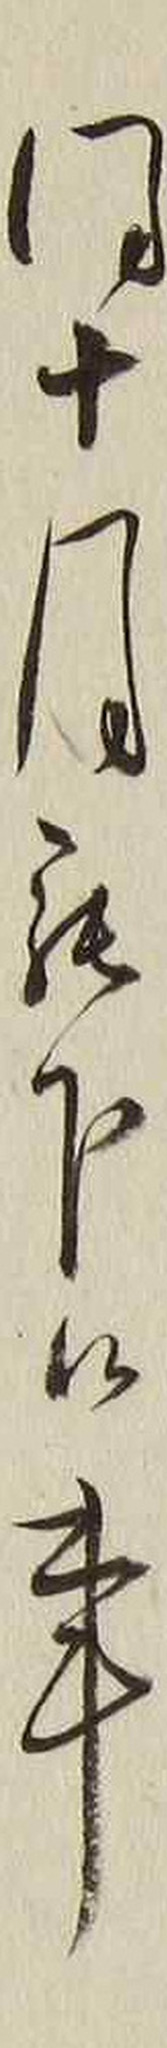同十月罷下候事
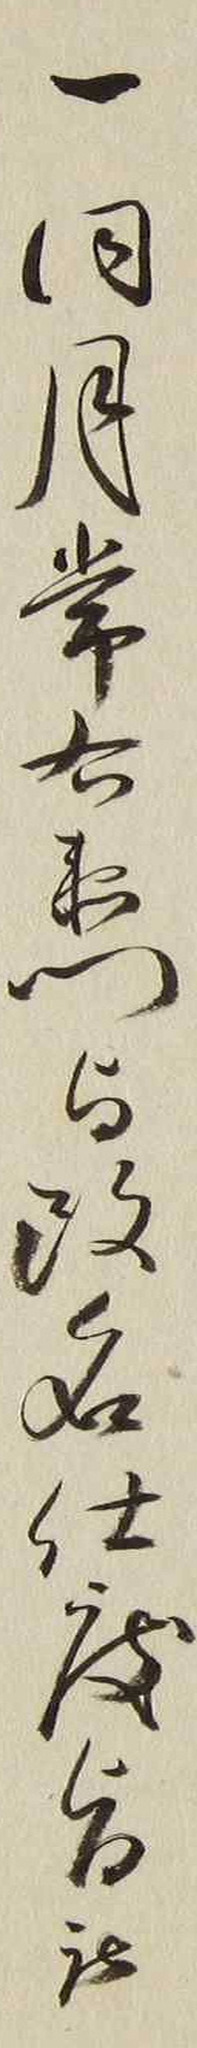一同月常右衛門と改名仕度旨被
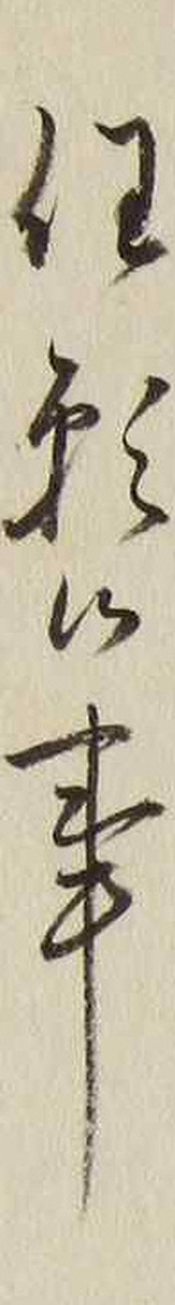任願候事
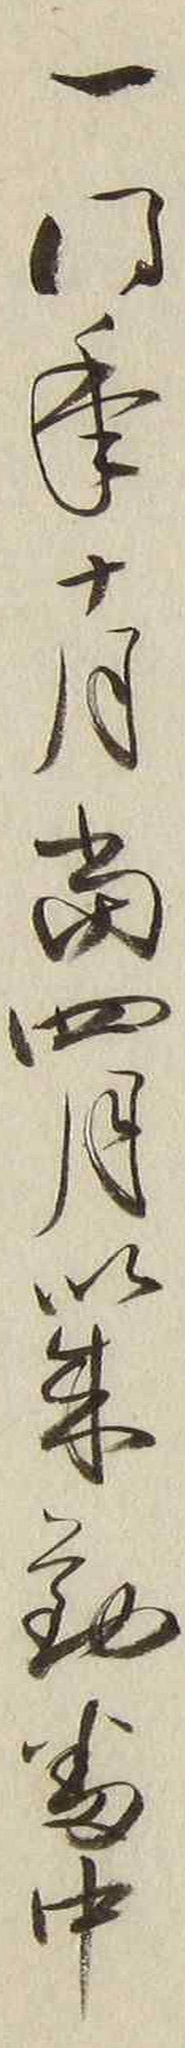一同年十月当四月以来勤番中
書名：諸士系譜　巻之163　な之部5
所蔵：会津若松市立会津図書館
